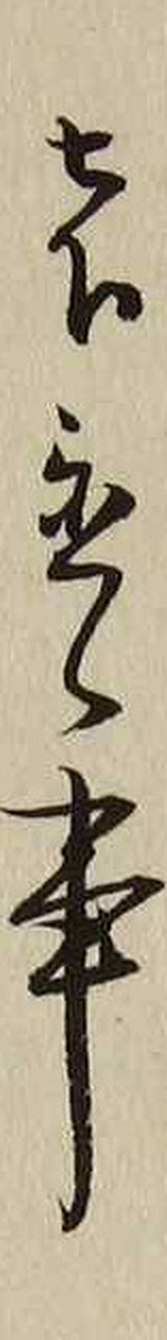被下置候事
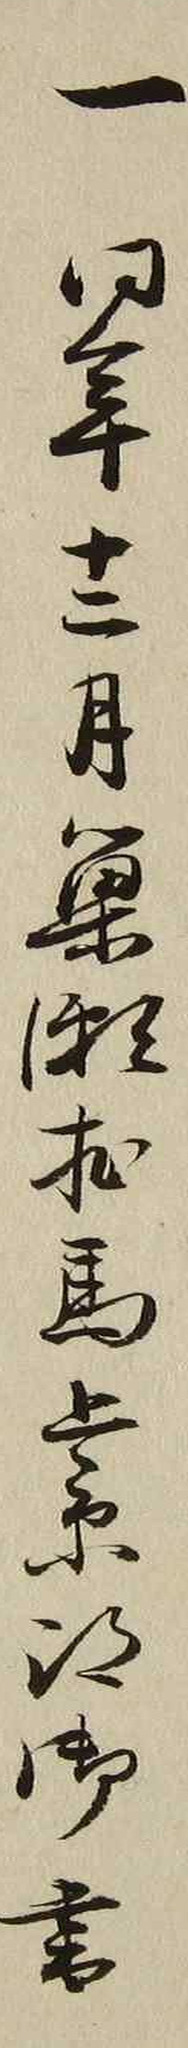一同年十二月巣瀬相馬上京跡御書
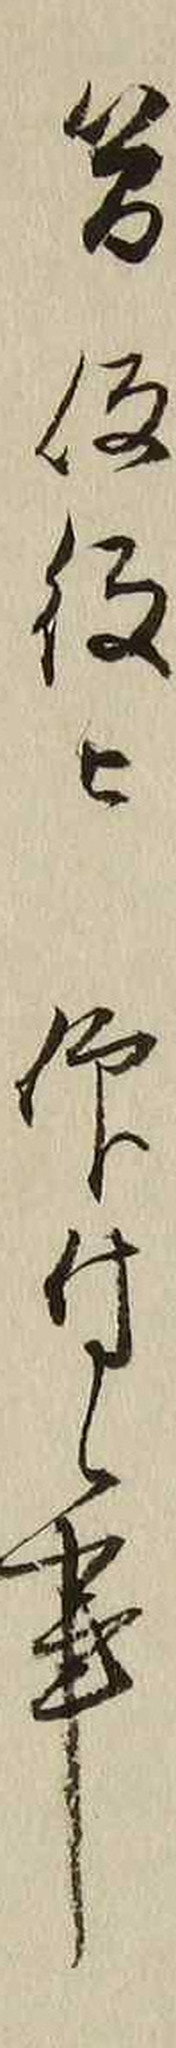簡仮役被仰付候事
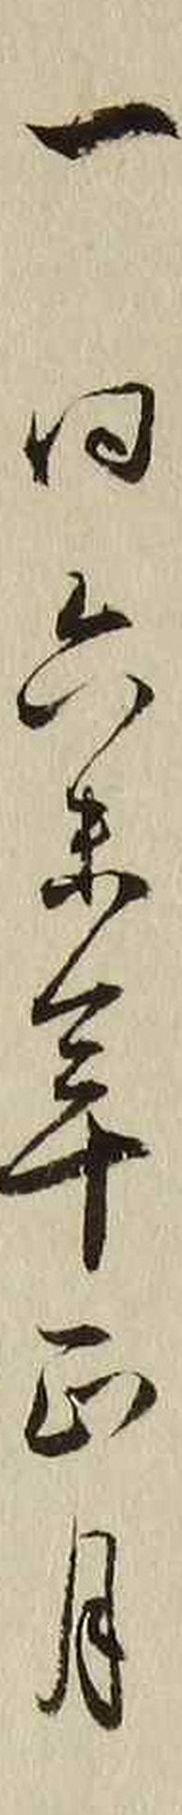一同六巳未年正月
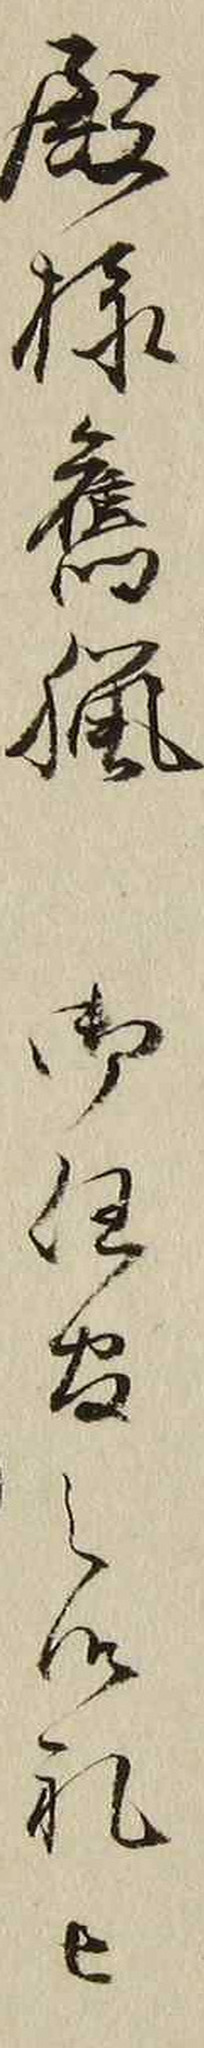殿様旧臘御任官之御礼被
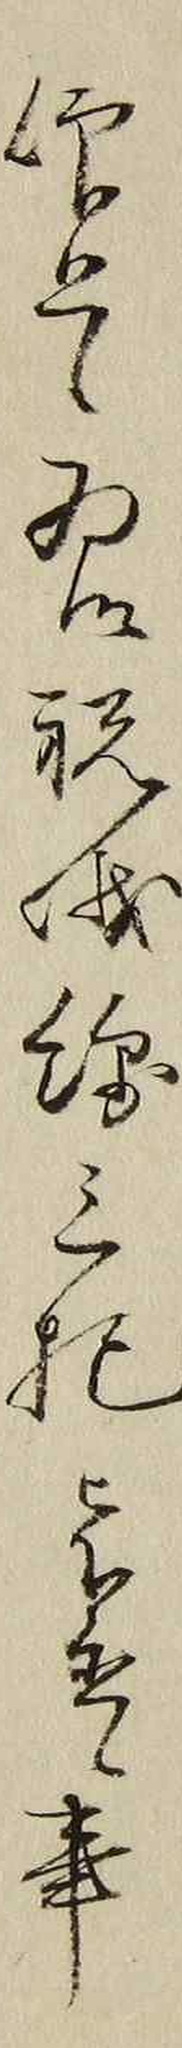仰上候為御祝儀綿三把被下置候事
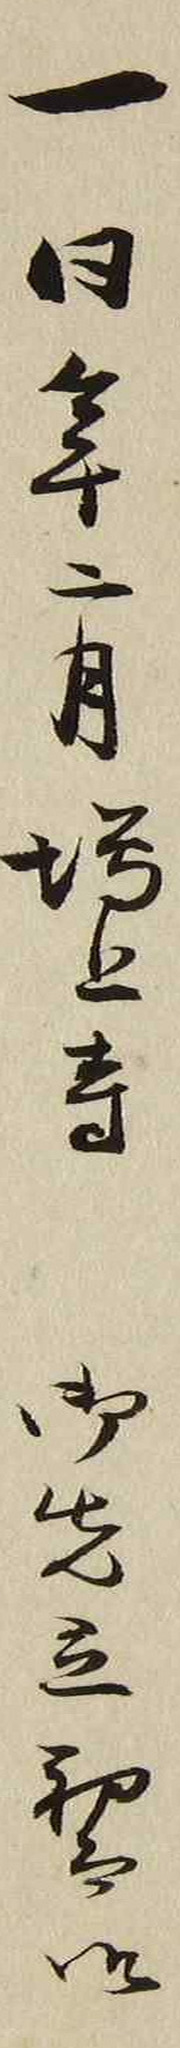一同年二月増上寺御先立初而御
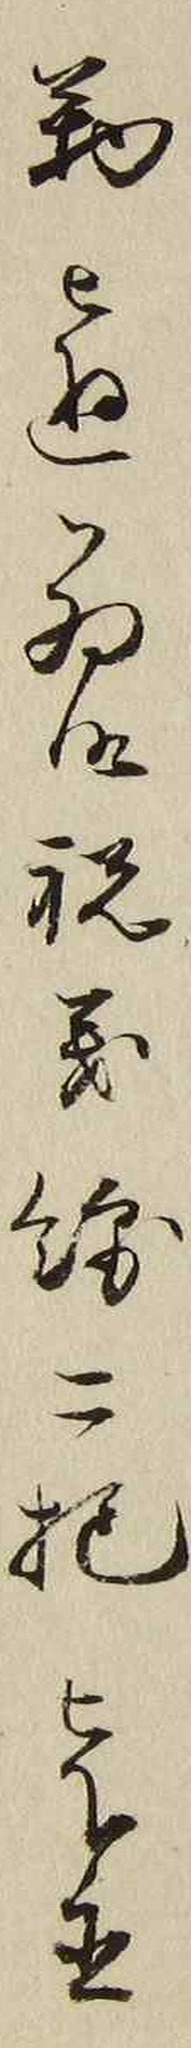勤被遊候為御祝義綿二把被下置
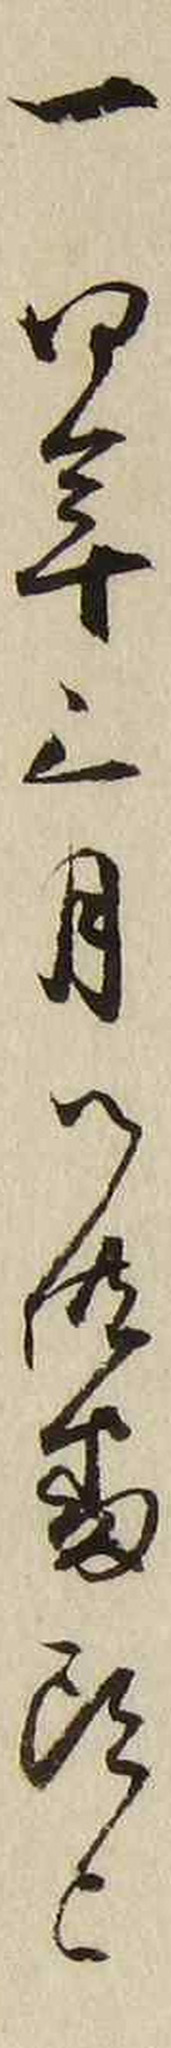一同年三月御供番頭被

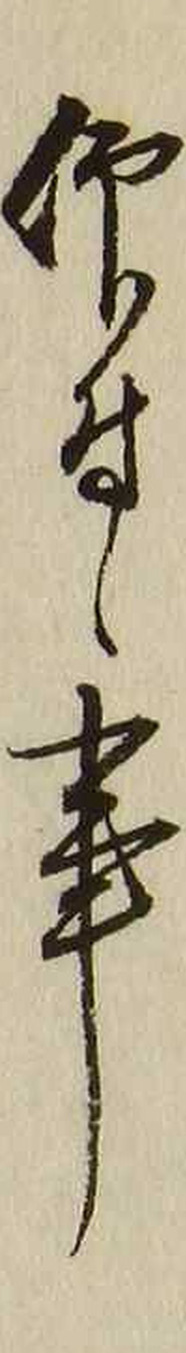仰付候事
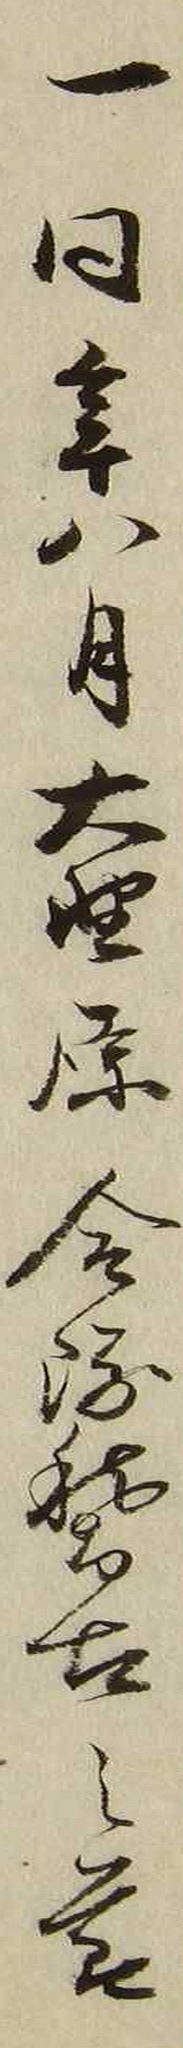一同年八月大野原合隊稽古之節
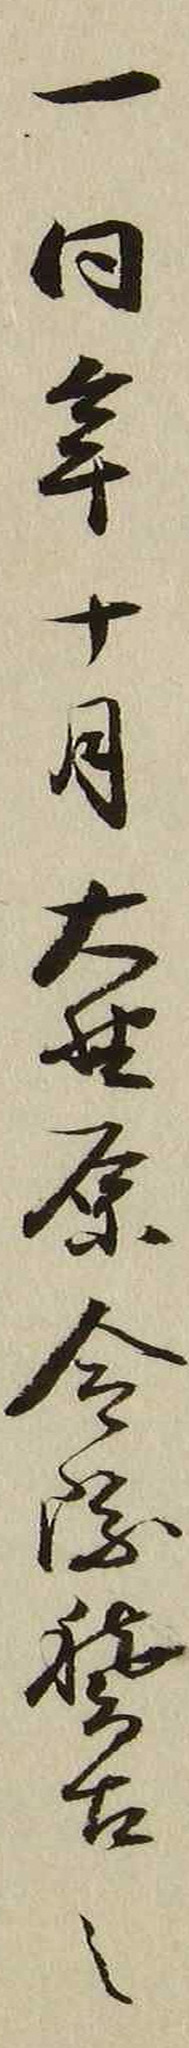一同年十月大野原合隊稽古之
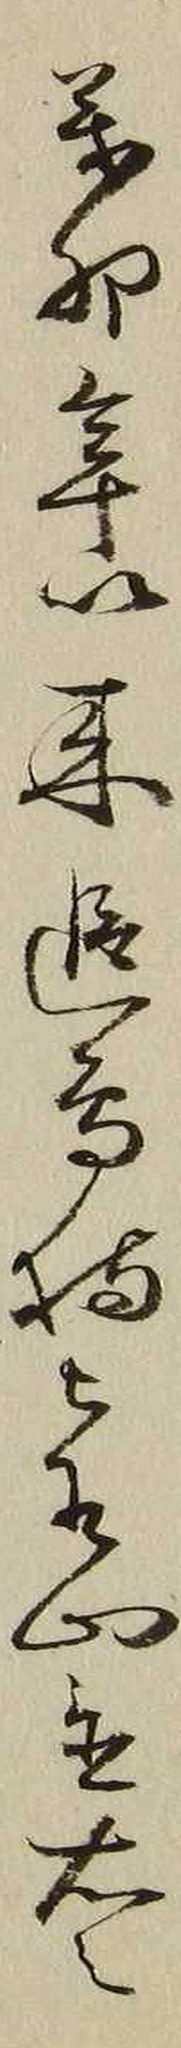義卯年以来追鳥狩被相止置右之
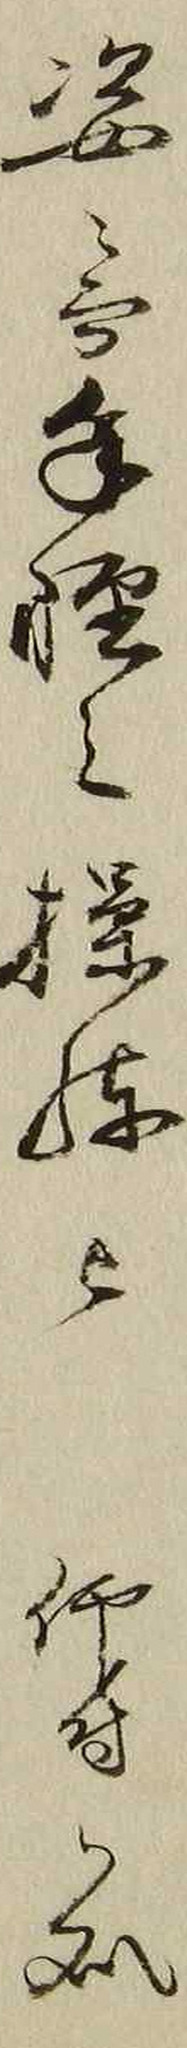姿に而手軽之繰練被仰付候処
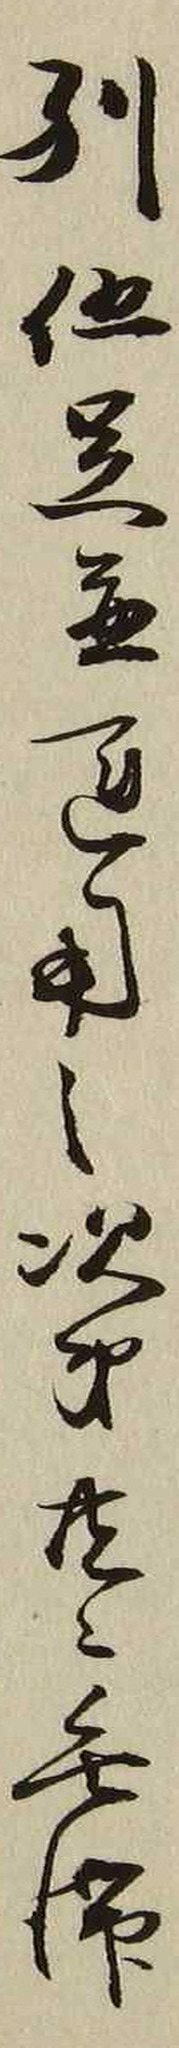列伍足並運用之次第共に無滞
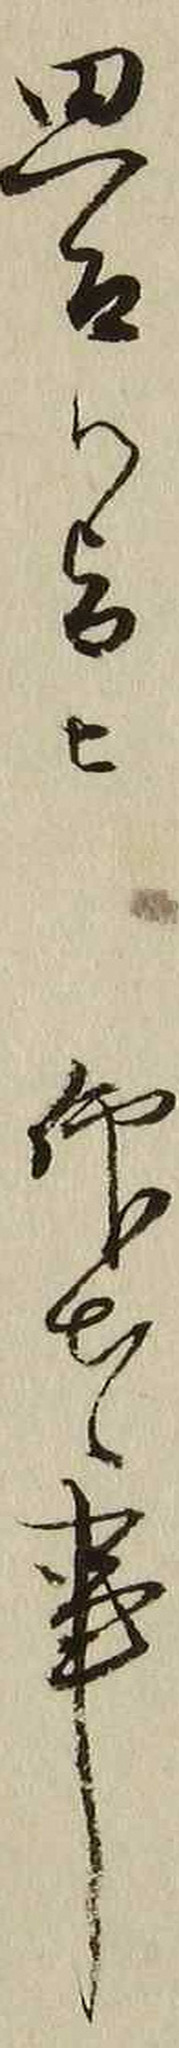思召候旨被仰出候事
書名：諸士系譜　巻之292　き之部1
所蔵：会津若松市立会津図書館
